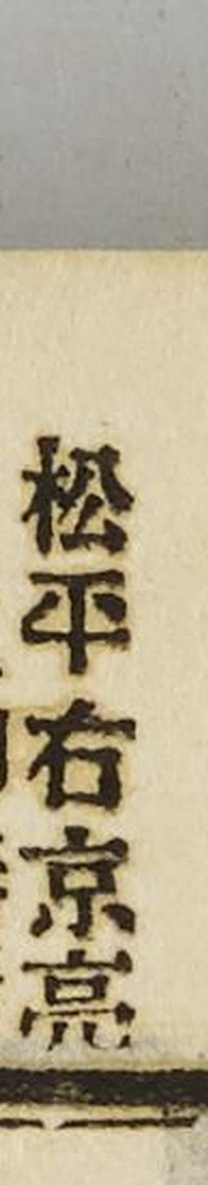松平右京亮
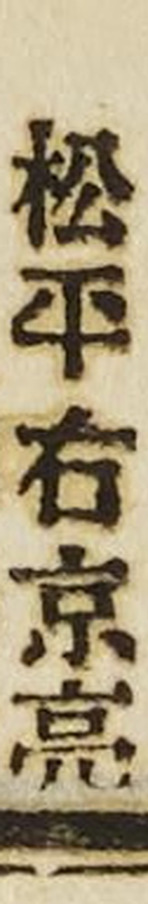松平右京亮
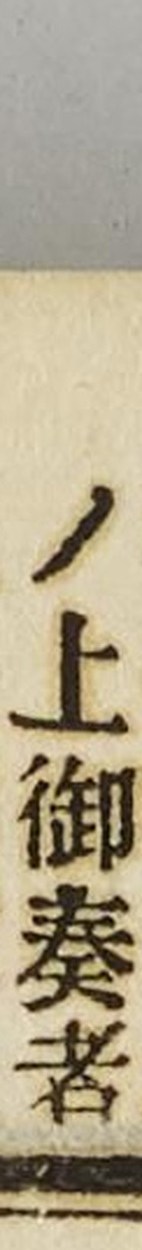ノ上御奏者
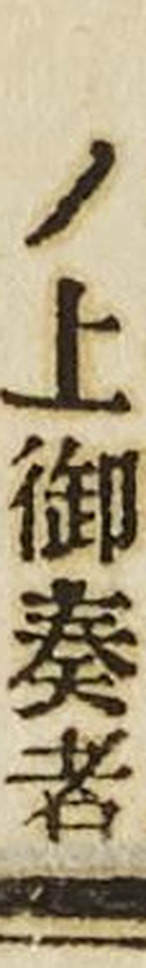ノ上御奏者
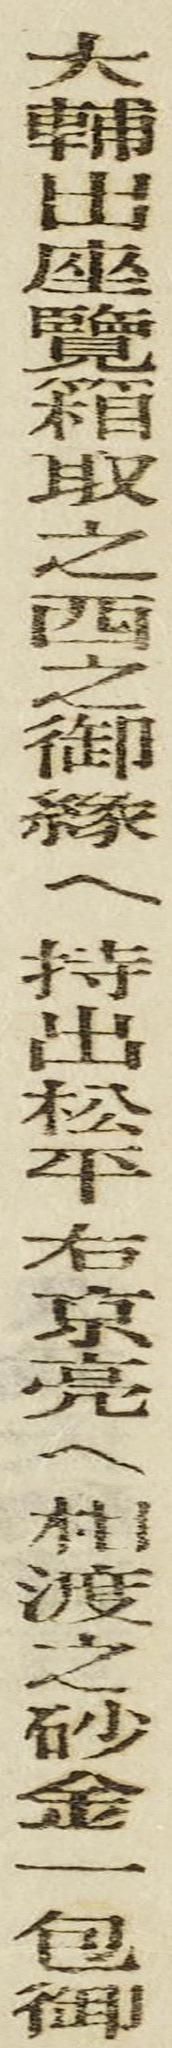大輔出座覧箱取之西之御縁へ持出松平右京亮へ相渡之砂金一包御
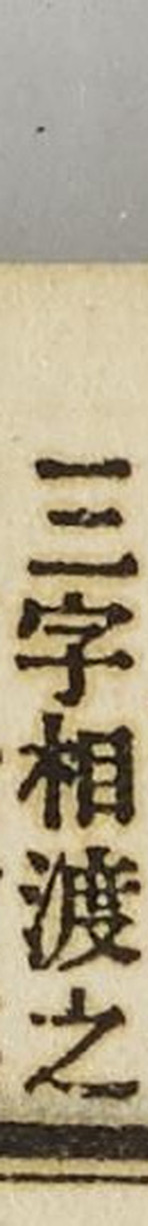三字相渡之
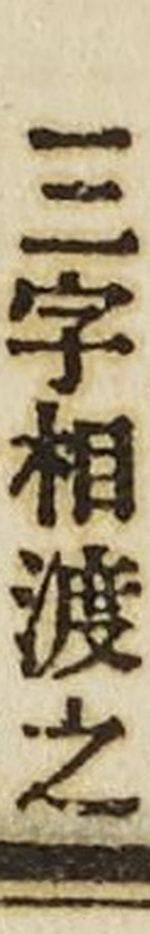三字相渡之
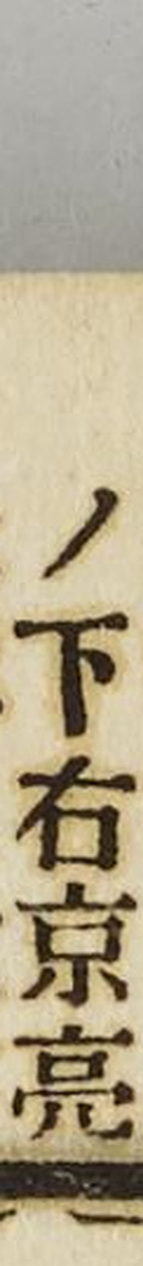ノ下右京亮
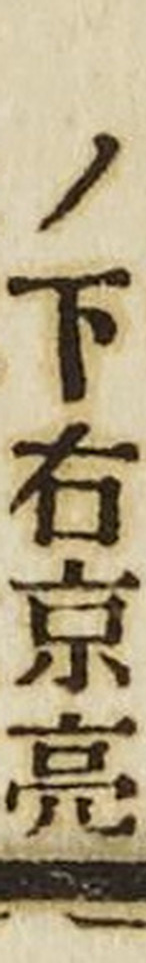ノ下右京亮
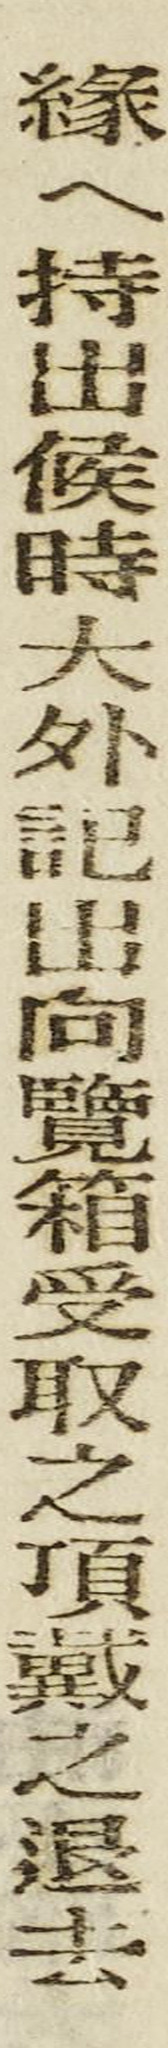縁へ持出候時大外記出向覧箱受取之頂戴之退去
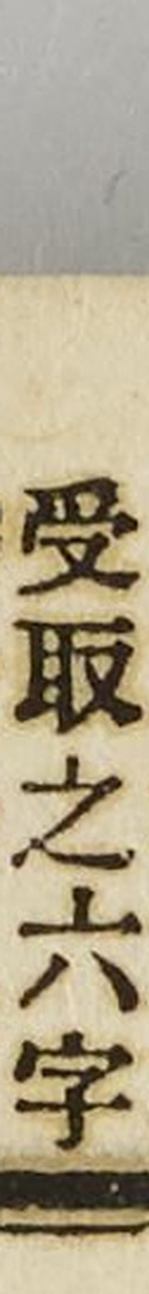受取之六字
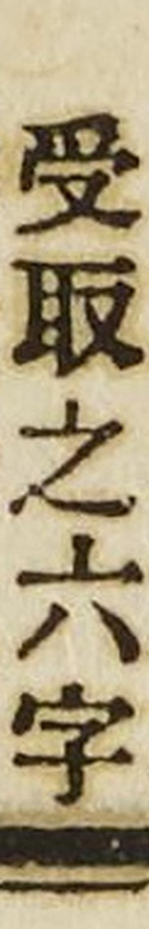受取之六字
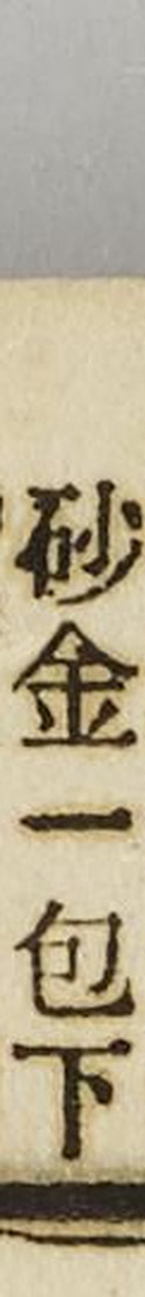砂金一包下
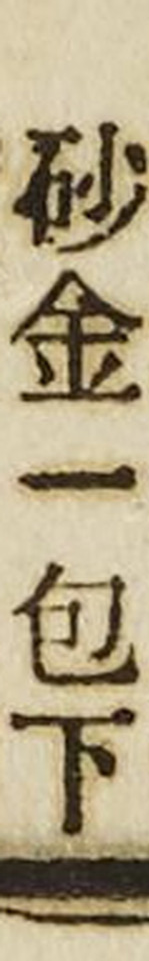砂金一包下
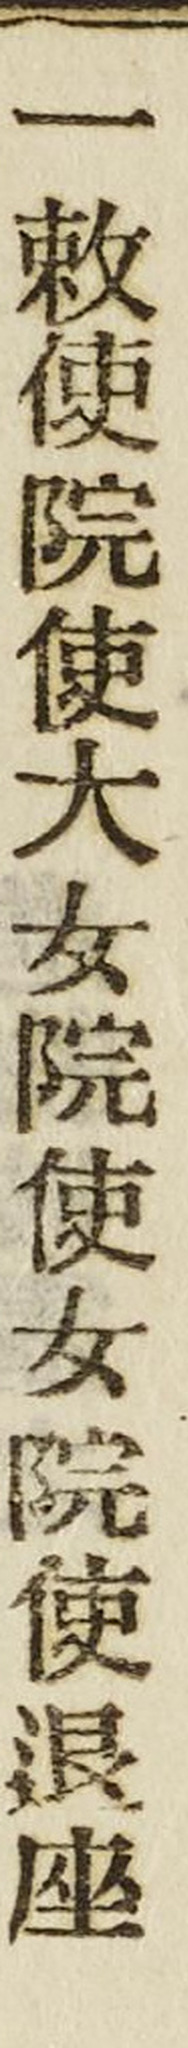一勅使院使大女院使女院使退座
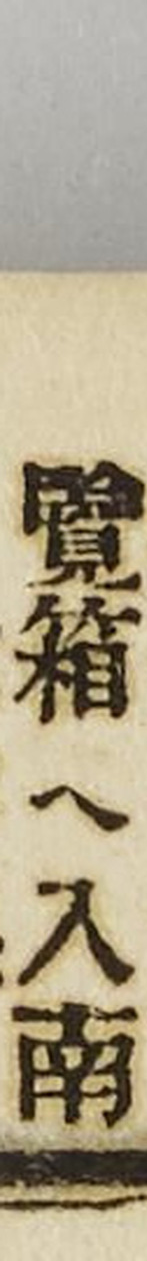覧箱へ入南
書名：史籍集覽　朝鮮陣古文・細井廣澤記・颶風紀事・天明七年將軍宣下次第書　全
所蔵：東京大学地震研究所図書室 Earthquake Research Institute Library, The University of Tokyo, JAPAN
